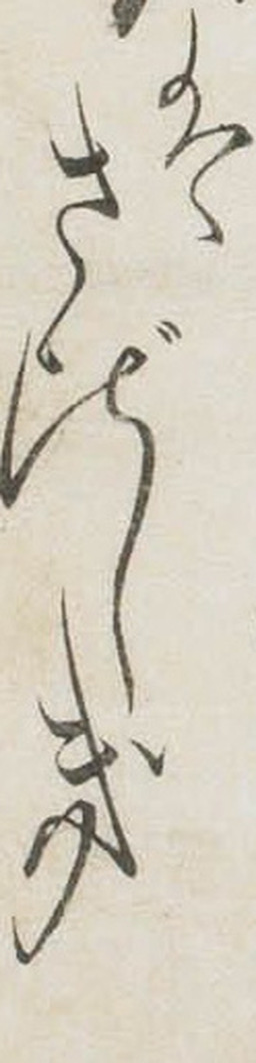さびしき

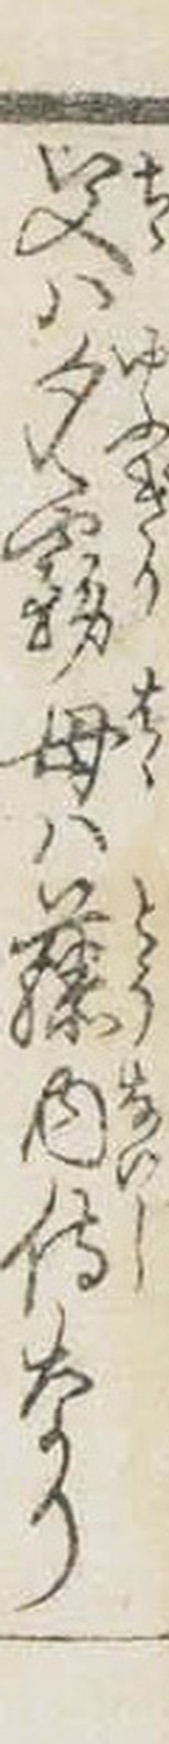父は夕霧母は藤内侍なり
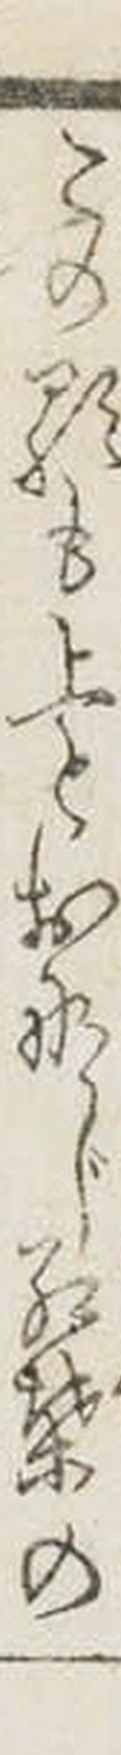この歌も上とおなじ紅葉の
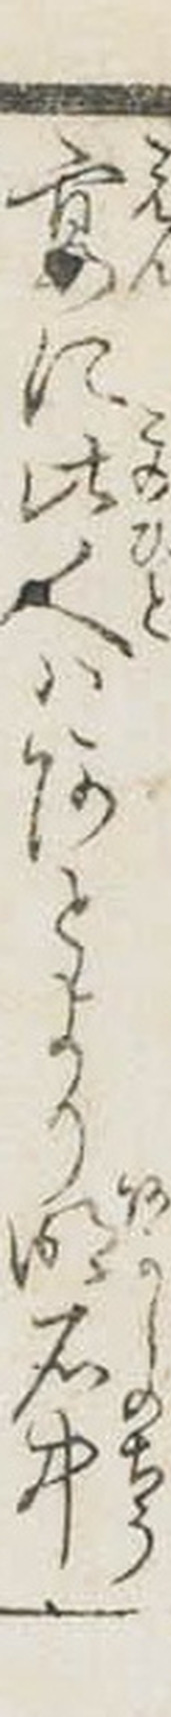宴に此人はあとより明石中
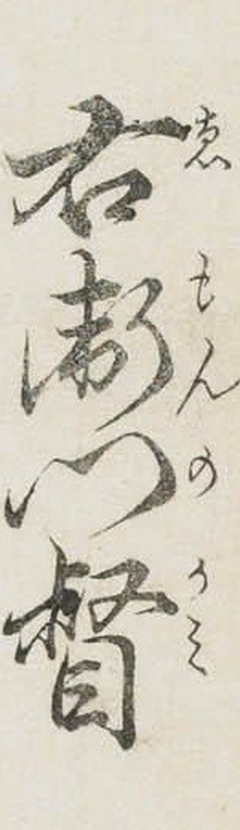右衛門督
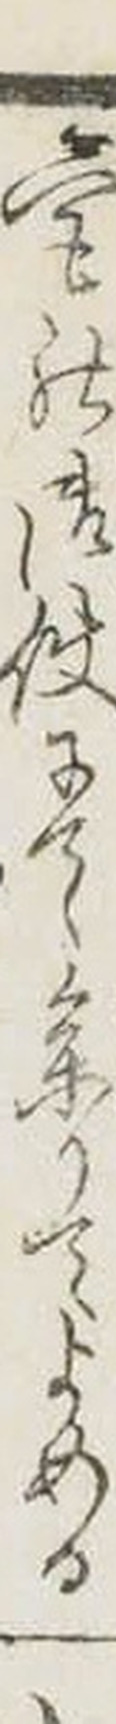宮の御使にて参りてよめる
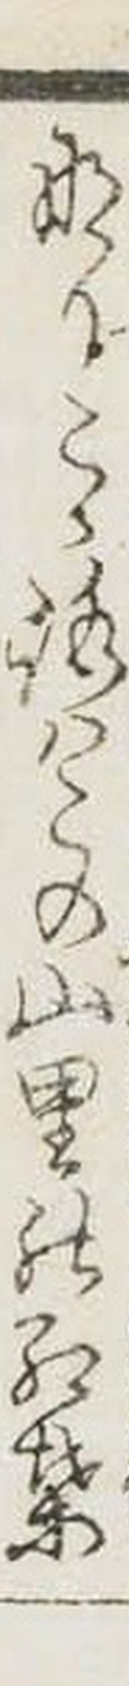なりこゝろはこの山里の紅葉
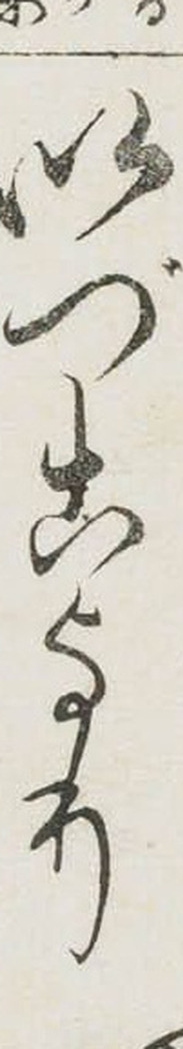いづこより
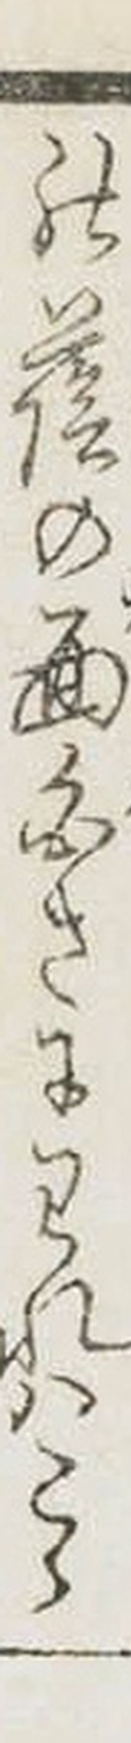の蔭の面白さにわれはこゝ
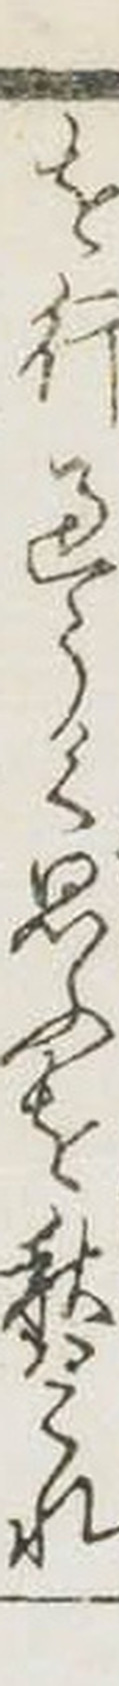を行過うく思ふを秋はこれ
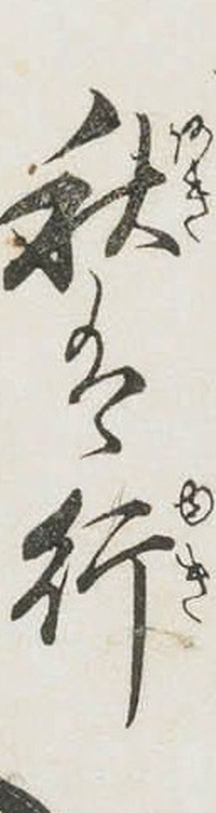秋は行
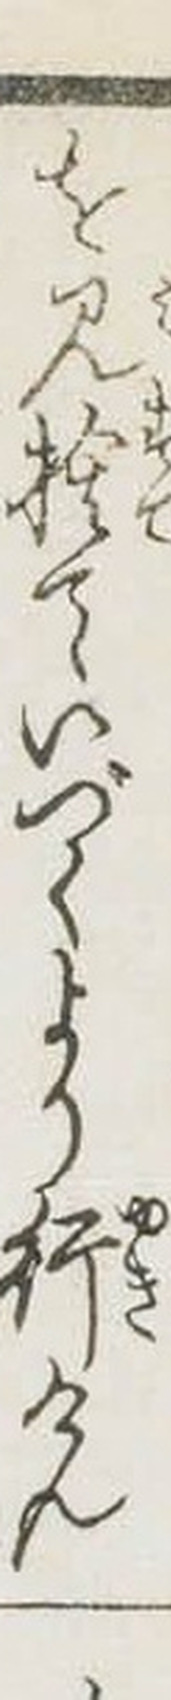を見捨ていづくより行けん
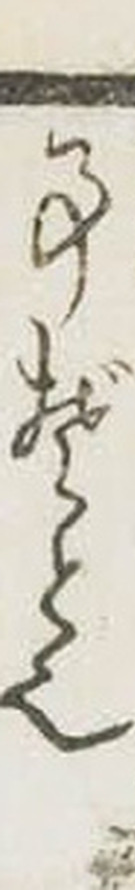事ぞと也
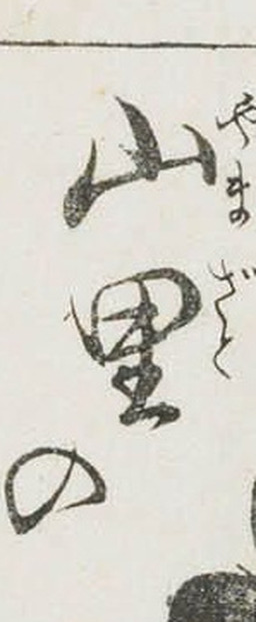山里の
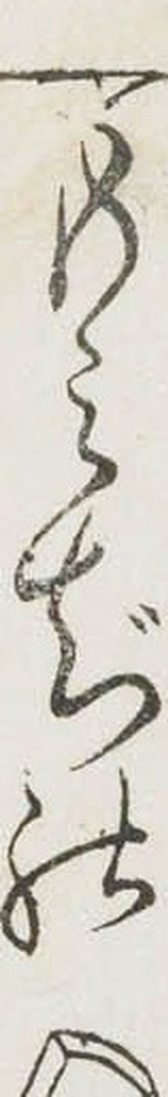もみぢの
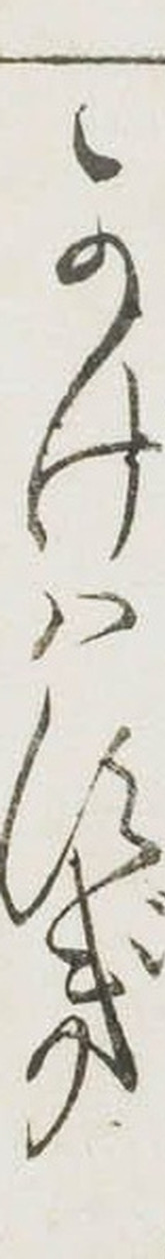かげはすぎ
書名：源氏百人一首
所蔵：東京学芸大学教育コンテンツアーカイブ
